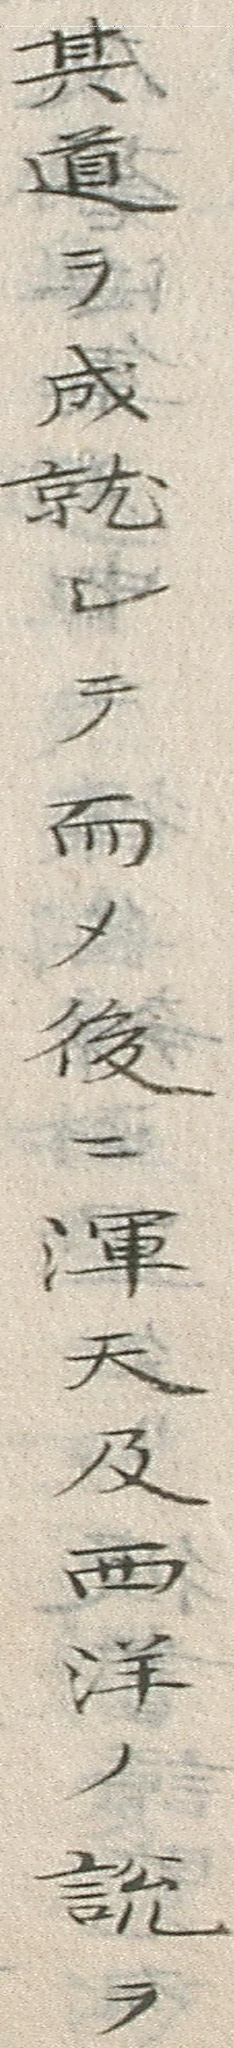其道ヲ成就シテ而シテ後ニ渾天及西洋ノ説ヲ
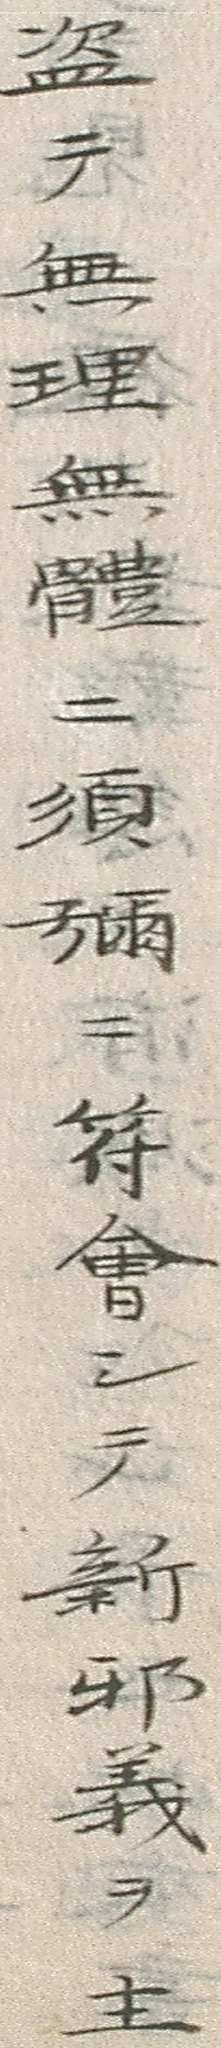盗テ無理無体ニ須弥ニ符会シテ新邪義ヲ主
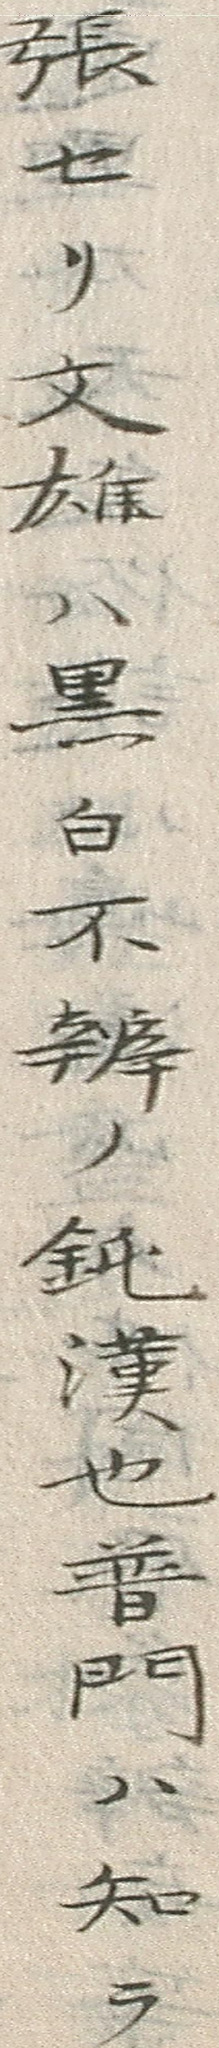張セリ文雄ハ黒白不弁ノ鈍漢也普門ハ知ラ
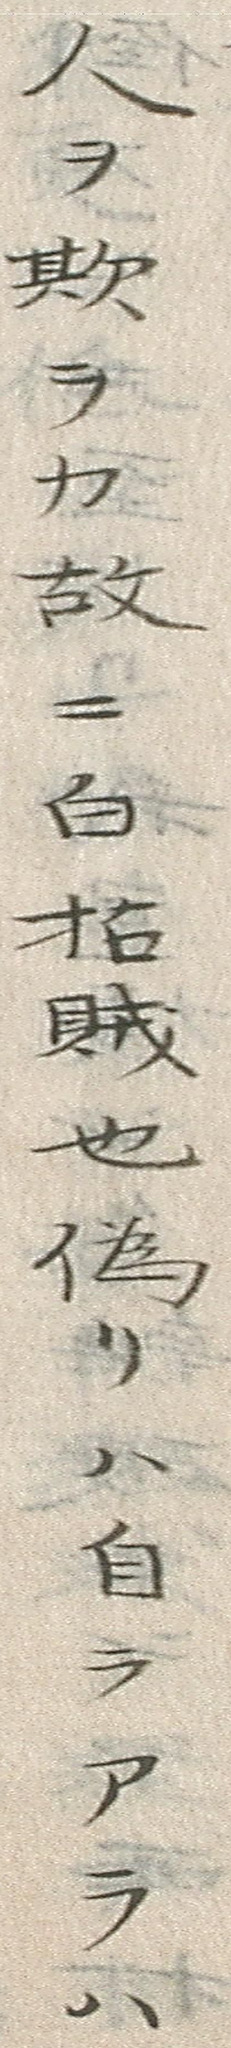人ヲ欺ヲカ故ニ白祐賊也偽リハ自ラアラハ
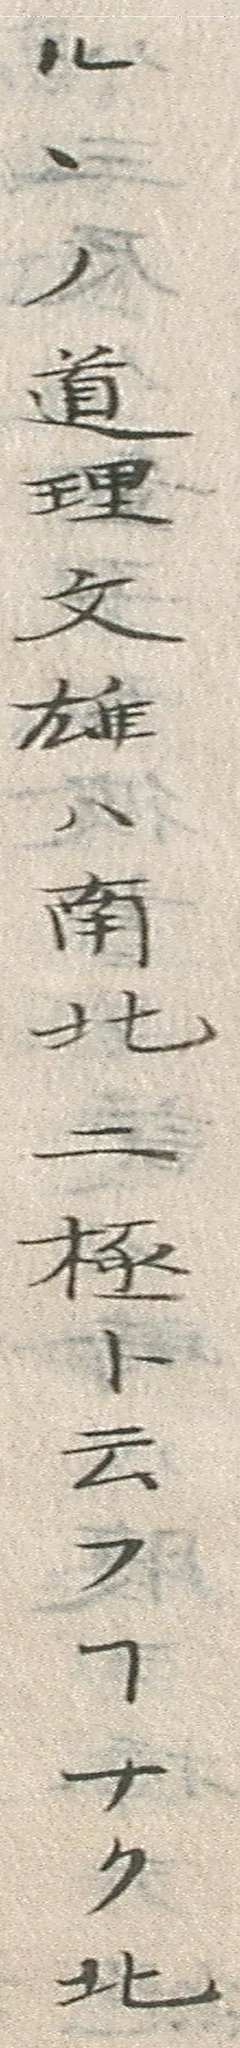ルヽノ道理文雄ハ南北ニ極ト云フコトナク北
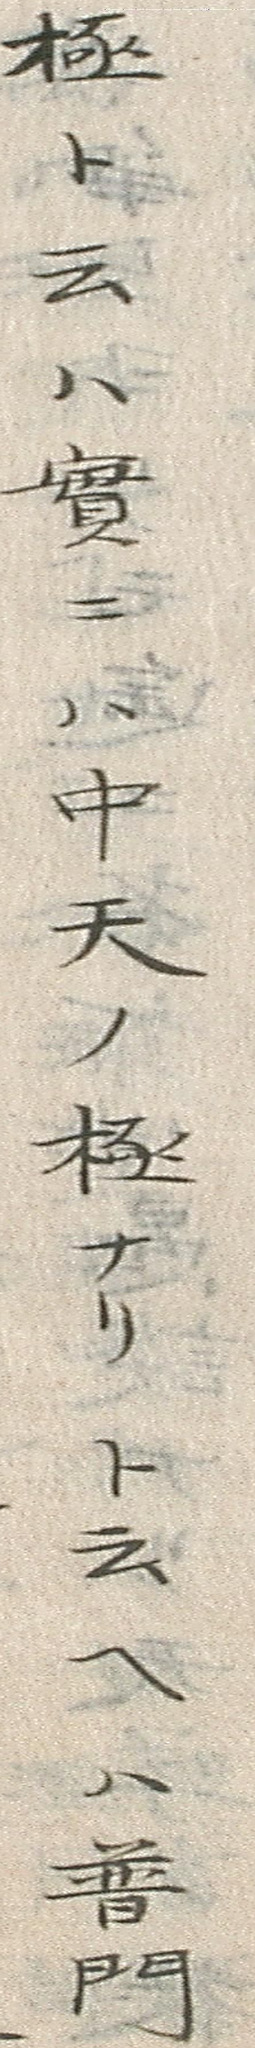極ト云ハ実ニハ中天ノ極ナリト云ヘハ普門
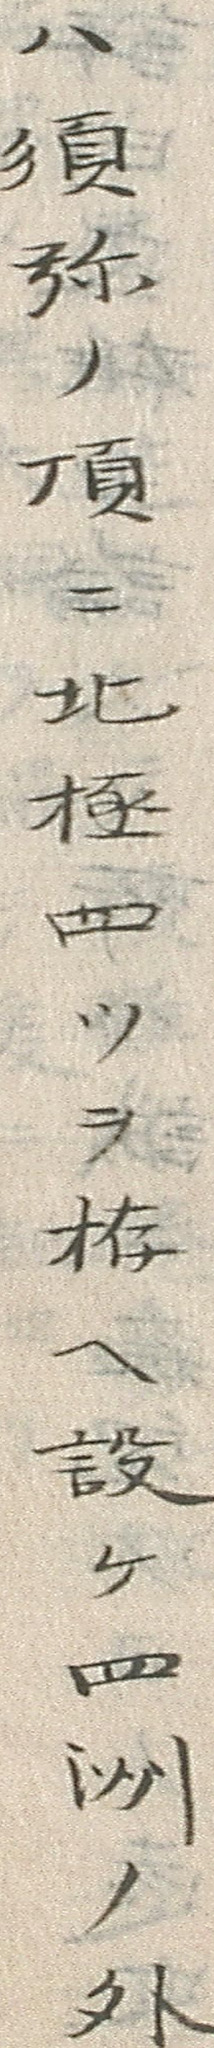ハ須弥ノ頂ニ北極四ッヲ拵ヘ設ケ四洲ノ外
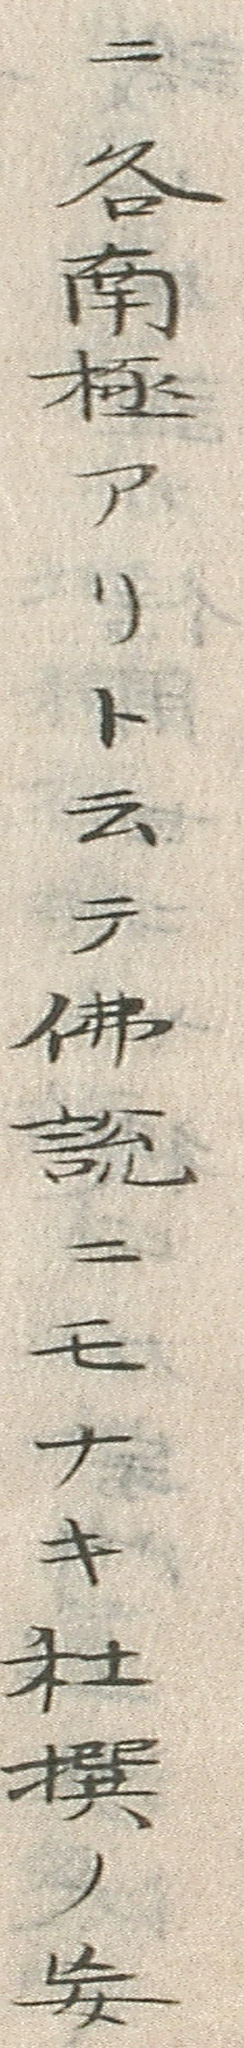ニ各南極アリト云テ仏説ニモナキ杜撰ノ妄
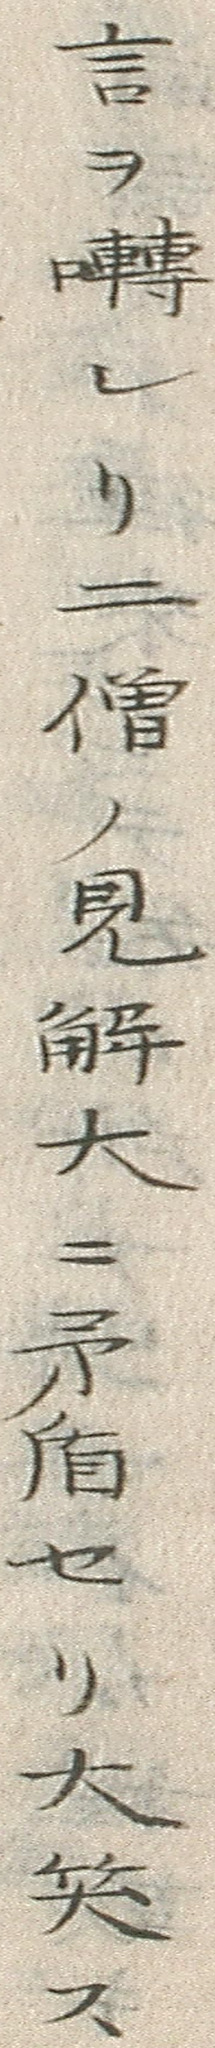言ヲ囀レリニ僧ノ見解大ニ矛盾セリ大笑ス
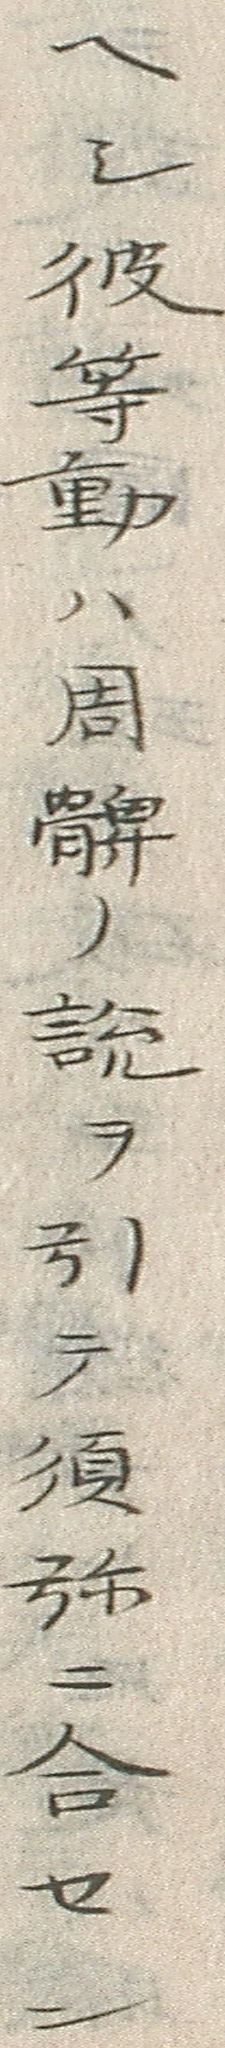ヘシ彼等動ハ周髀ノ説ヲ引テ須弥ニ合セン
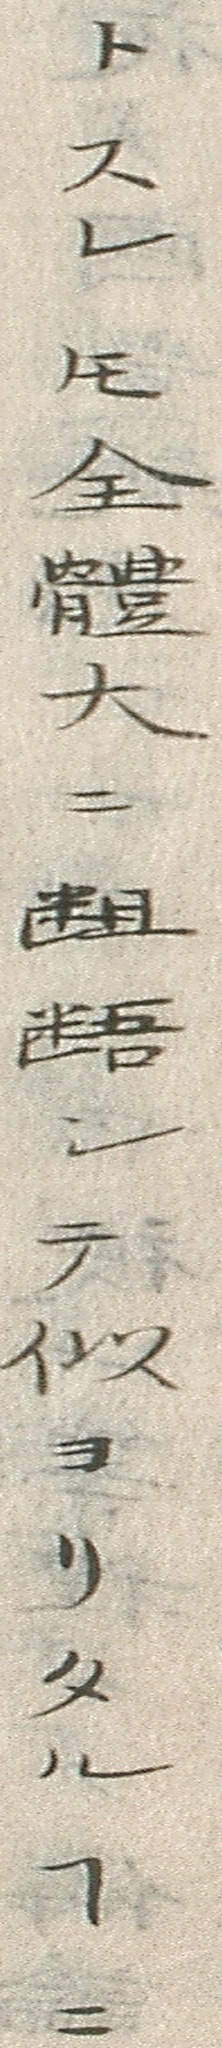トスレトモ全体大ニ齟齬シテ似ヨリタルコトニ
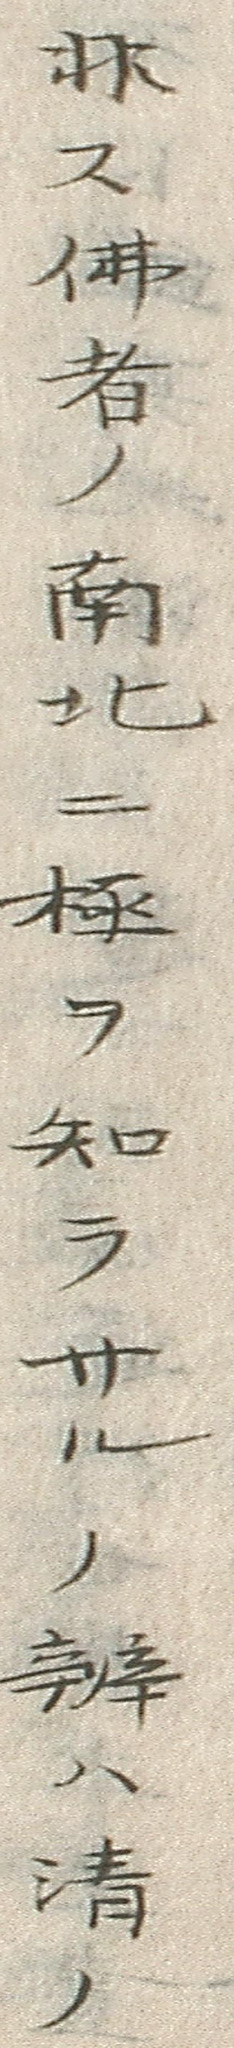非ス仏者ノ南北ニ極ヲ知ラサルノ弁ハ清ノ
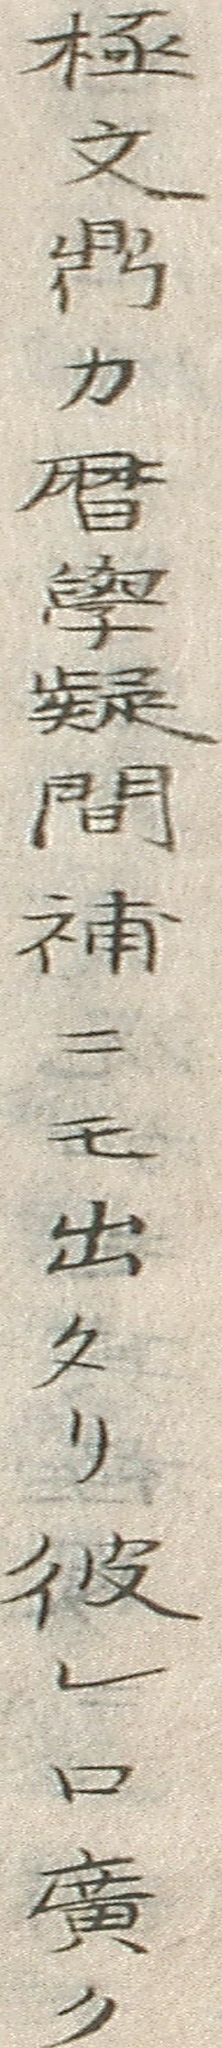極文鼎カ暦学疑間補ニモ出タリ彼レノ口広ク
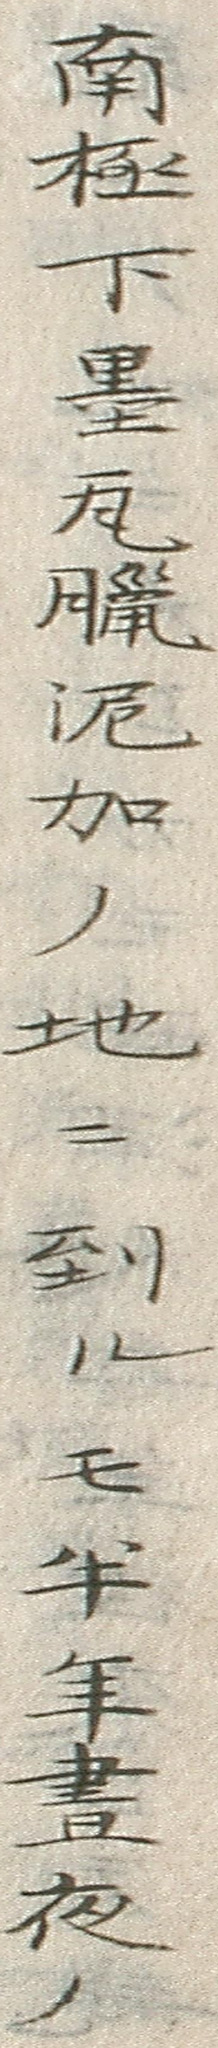南極下墨瓦臘泥加ノ地ニ到ルモ半年昼夜ノ
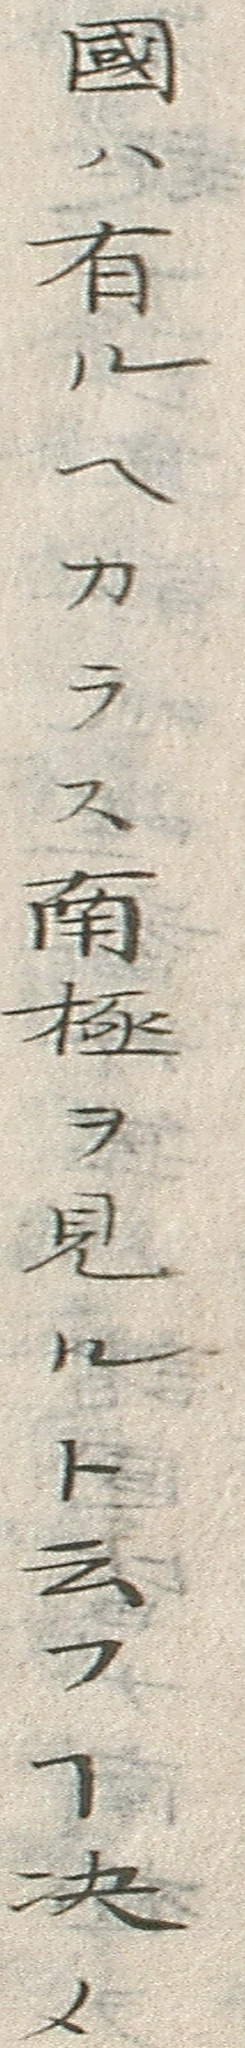国ハ有ルヘカラス南極ヲ見ルト云フコト决シテ
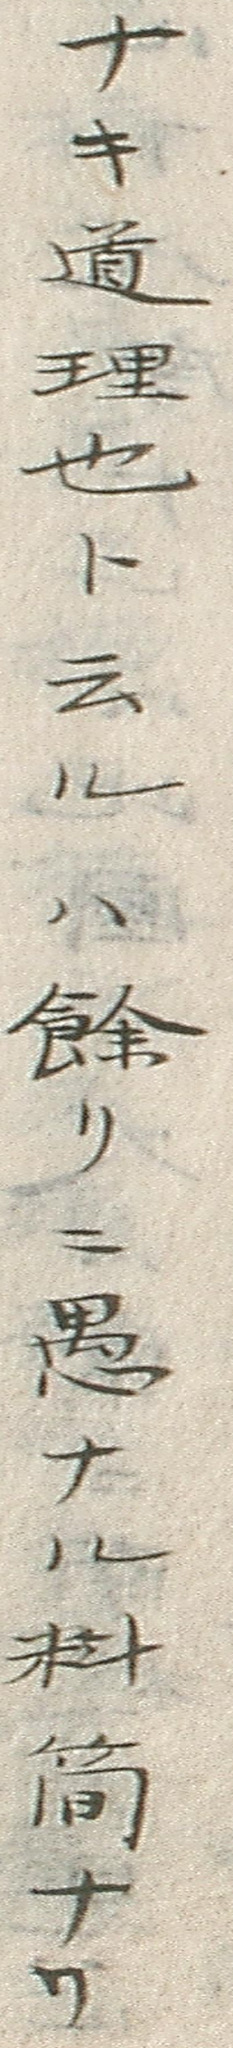ナキ道理也ト云ルハ余リニ愚ナル料簡ナリ
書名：天學略名目羽翼　全
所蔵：東京大学地震研究所図書室 Earthquake Research Institute Library, The University of Tokyo, JAPAN
